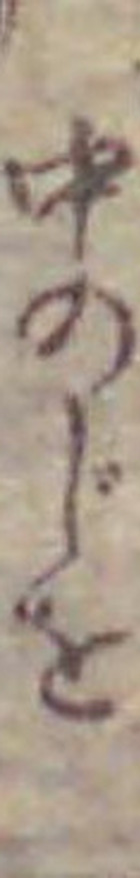中のじを
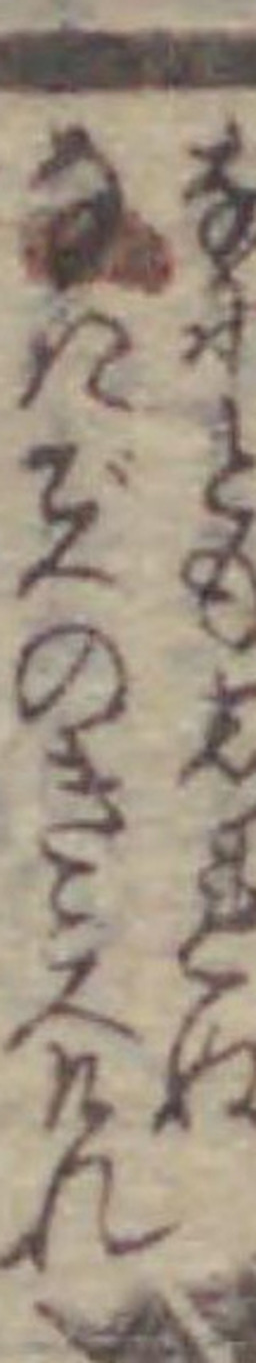なきごへのきこへけれ
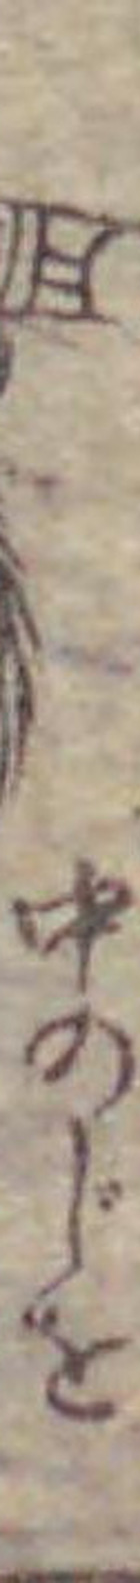中のじを
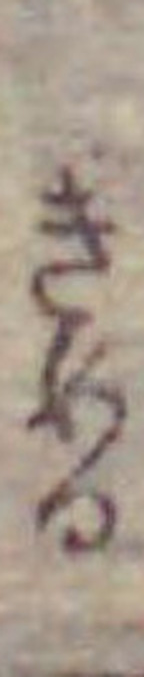きめる
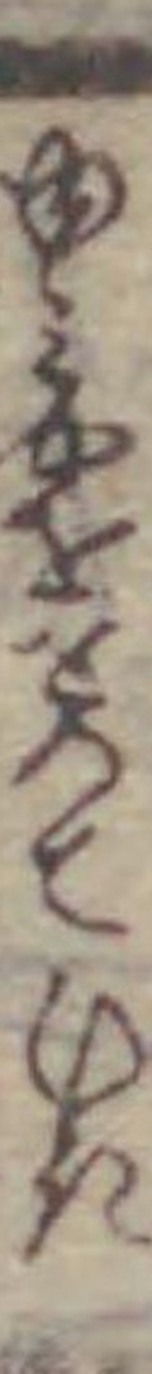ゆみやををつてひき
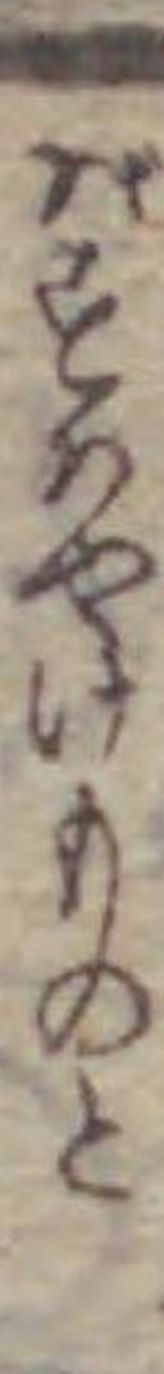ばすはやけものと
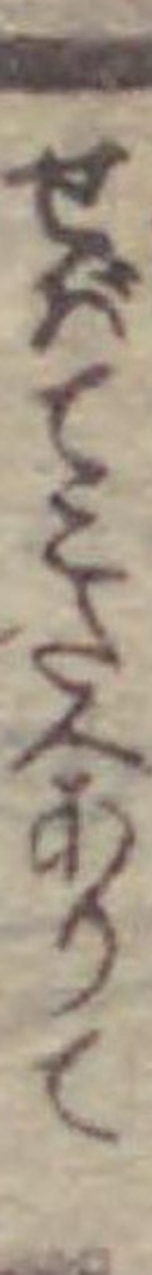せばてこたへありて
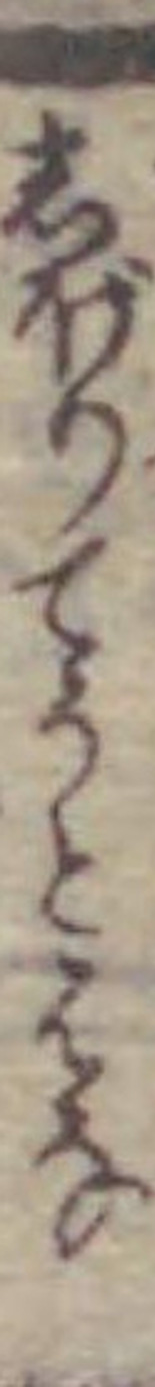しぼりてうとはな
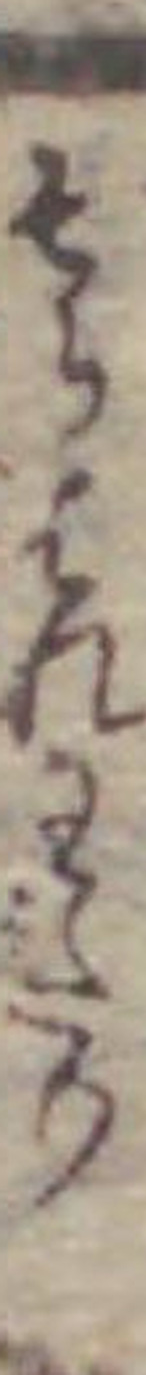そらはれわたり
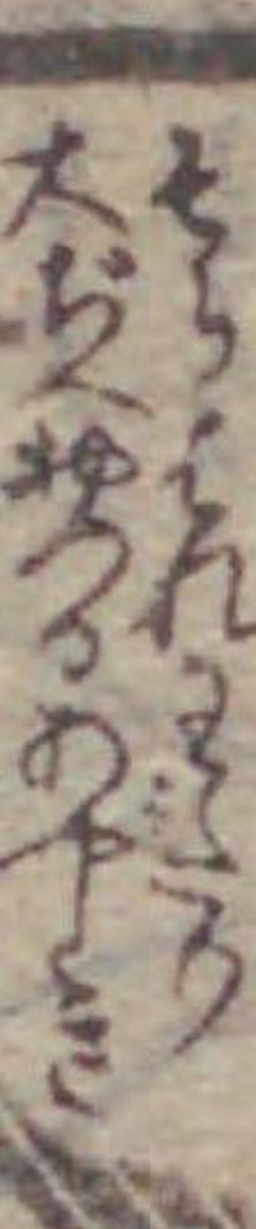大ぢへおつるあやしき
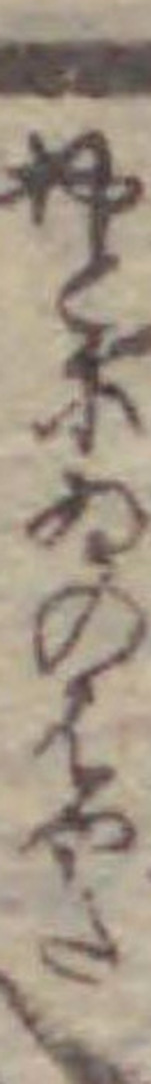おとにゐのはやた
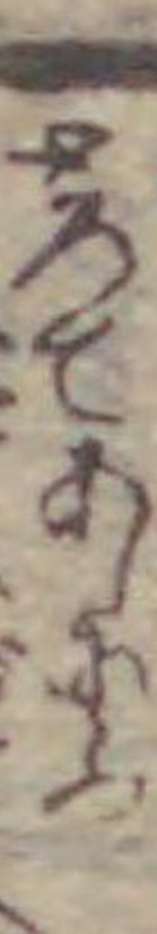とつてあしにふ
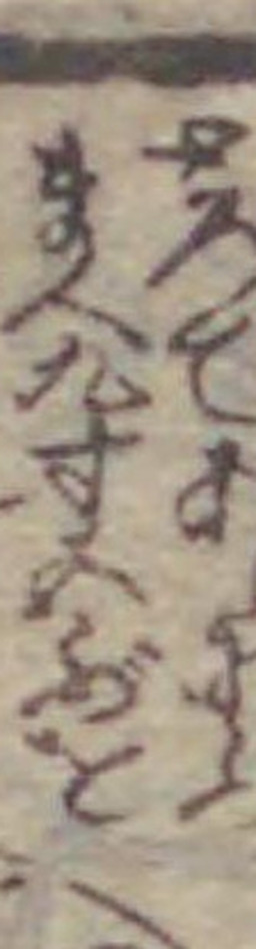まへ九寸五ぶを
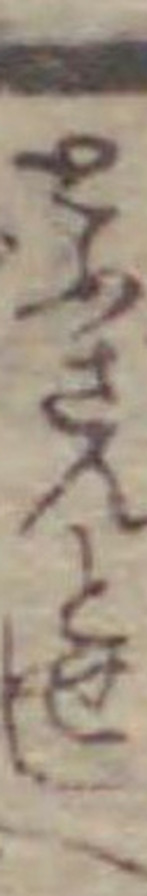とうさんとせし
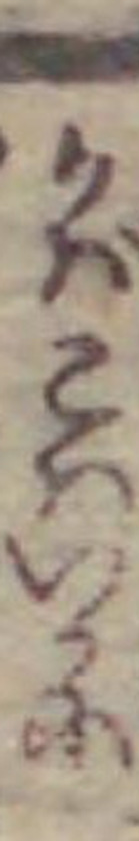かばこはいかに
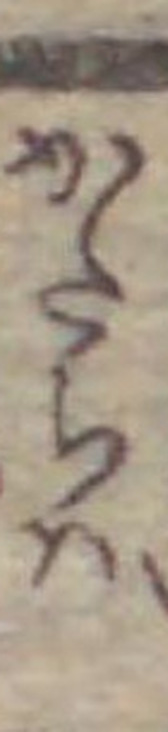かたちは
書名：武家物奇談 : 3巻
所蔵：国立国会図書館 National Diet Library, JAPAN
